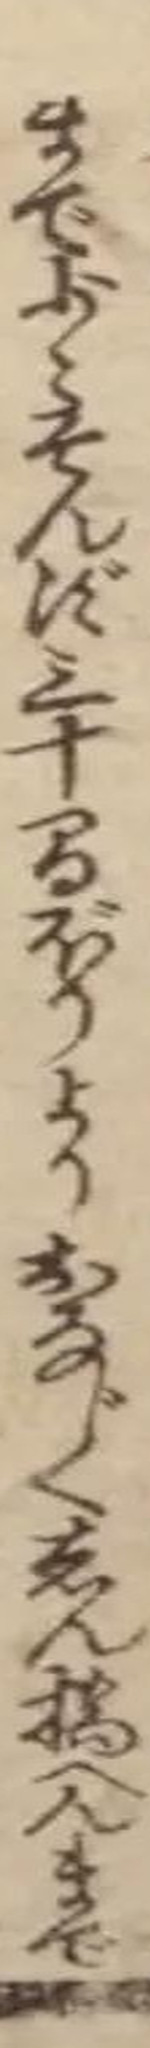まで少々そんず三十間ぼりよりおなじくしん橋へんまで
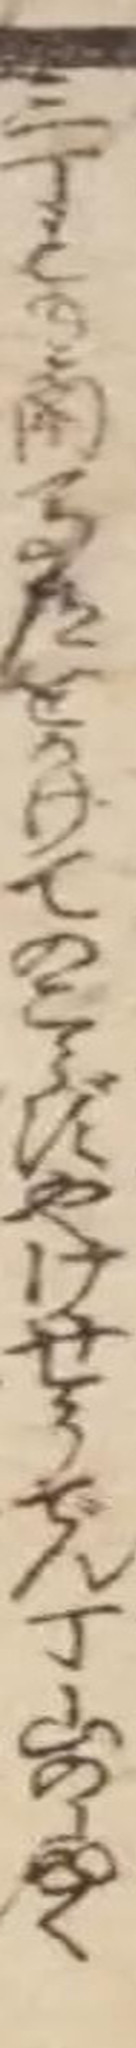三丁とも南馬道をかけて残らずやけせうでん丁山のしゆく
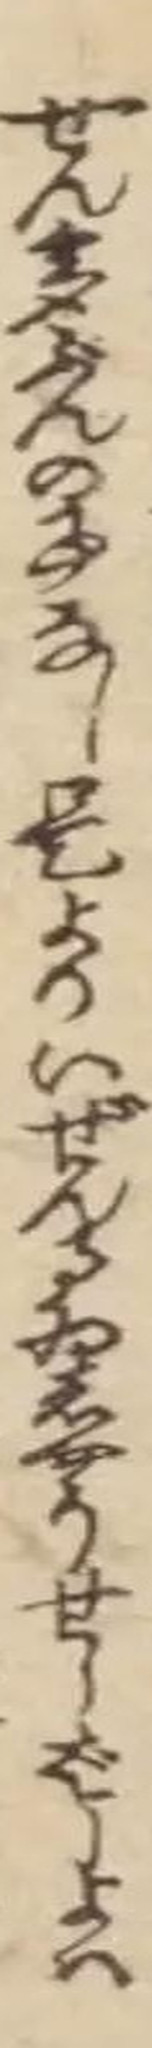せん多ぶんの事なし是よりいぜんるゐしやうせしばしよは
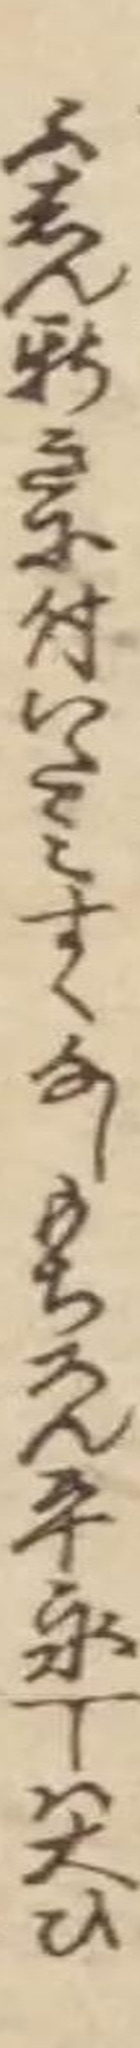ふしん新きに付いたみすくなしもちろん平永丁は大ひ
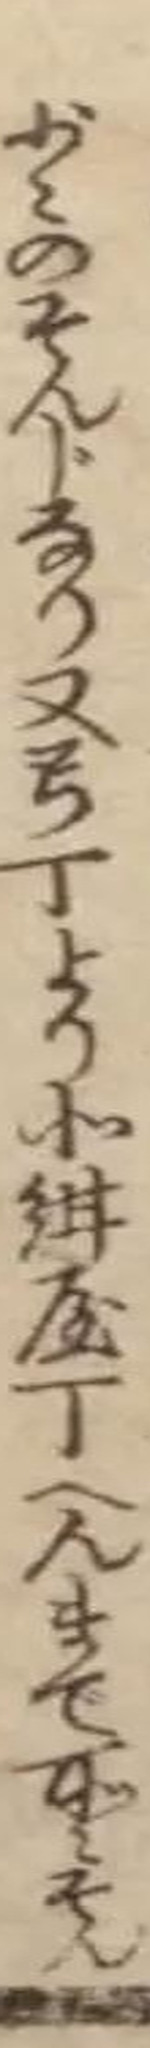少々のそんじなり又弓町より北紺屋丁へんまで所々そん
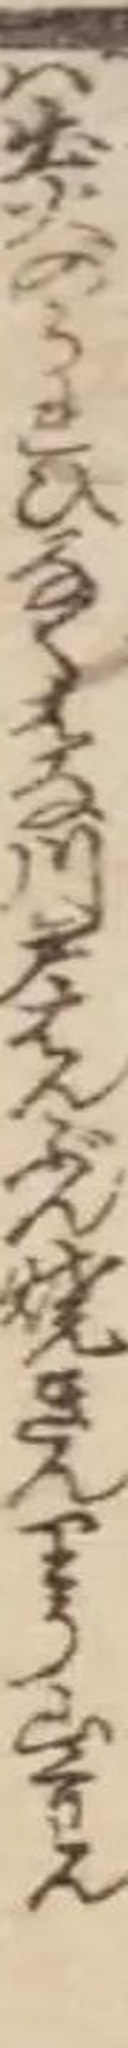は出火のうれひなくはな川戸はんぶん焼きんりう山くわん
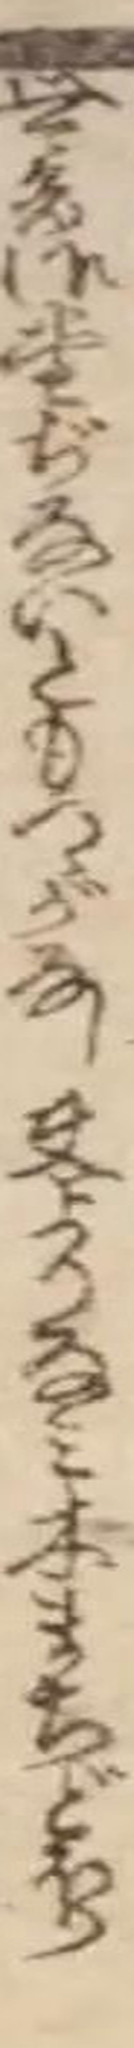世音御堂ぢないともつゝがなし夫よりなみ木まちどほり
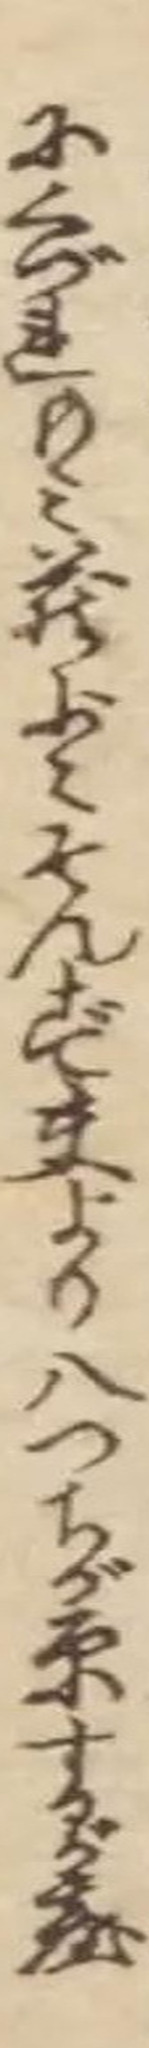にくづれもみ蔵少〃そんず夫より八つちが原するが台
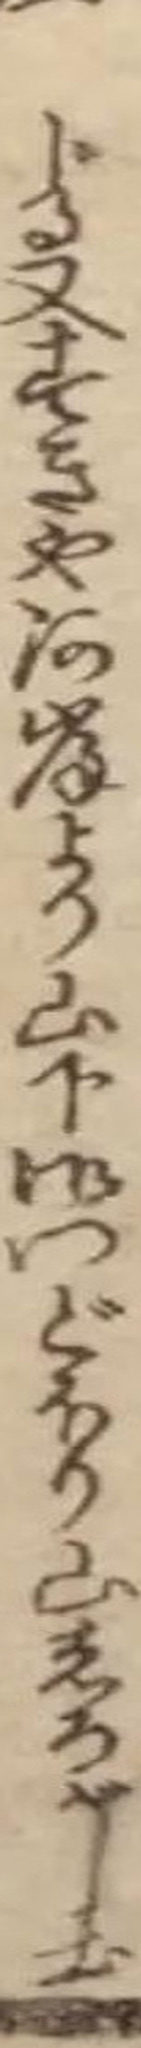じる又すきや河岸より山下御門どほり山しろやしき
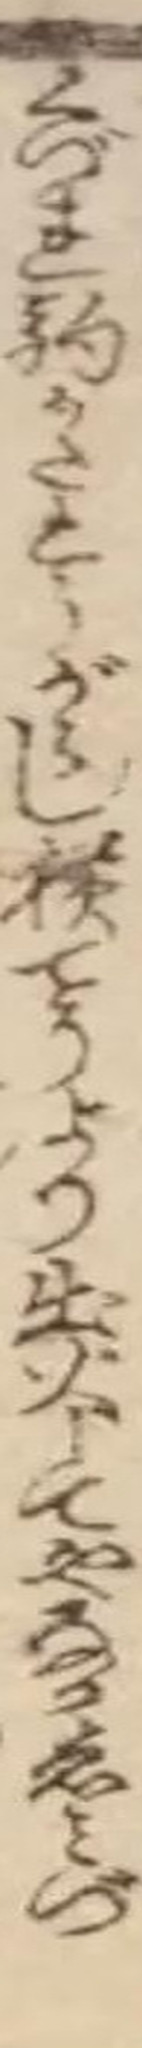くづれ駒かたとうがらし横てうより出火してやなかしみづ
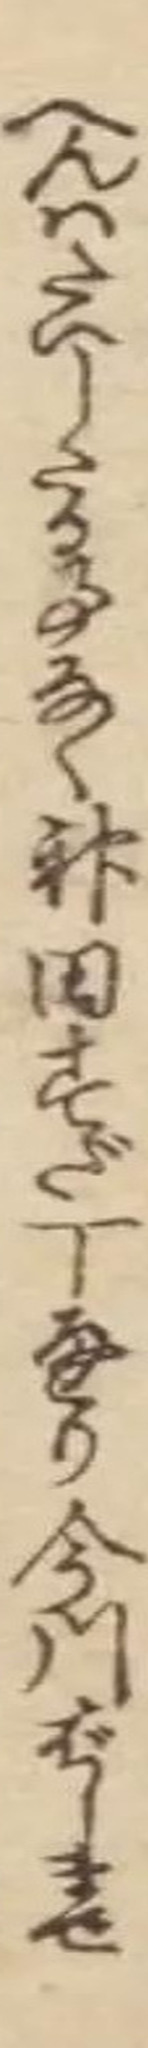へんはたいしたる事なく神田すだ丁通り今川ばしまで
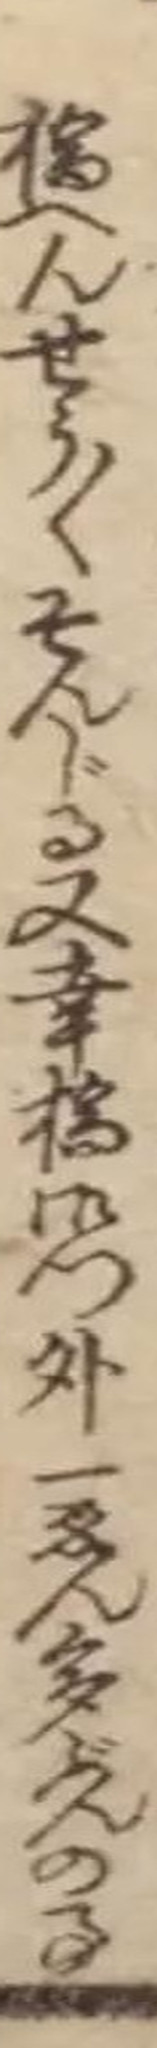橋へんせう〳〵そんじる又幸橋御門外一ゑん多ぶんの事
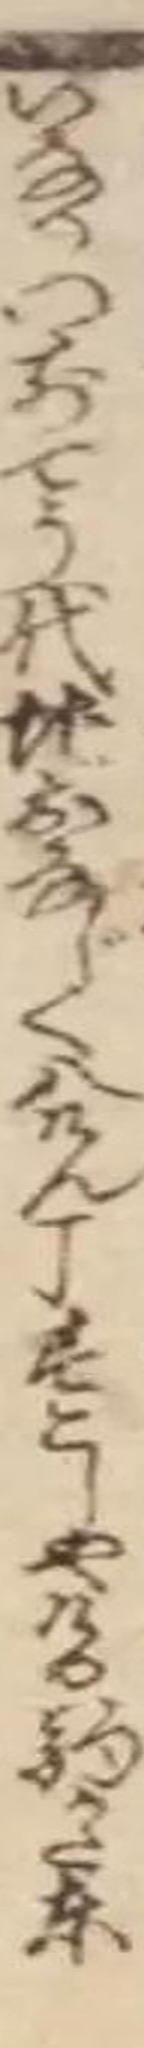いなり門前てう代地おなじく八けん丁すこしやける駒かた東
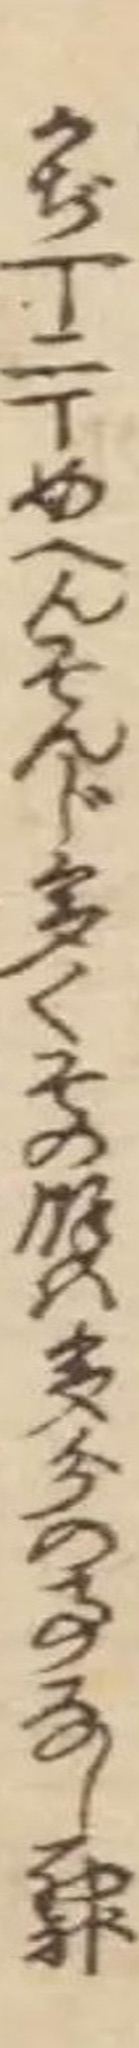かぢ丁二丁めへんそんじ多くその余は多分の事なし西神
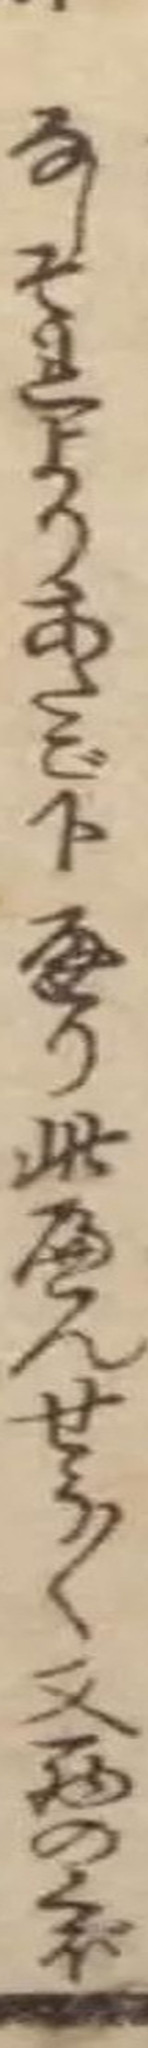なしそれよりあたご下通り此辺んせう〳〵又西のくぼ
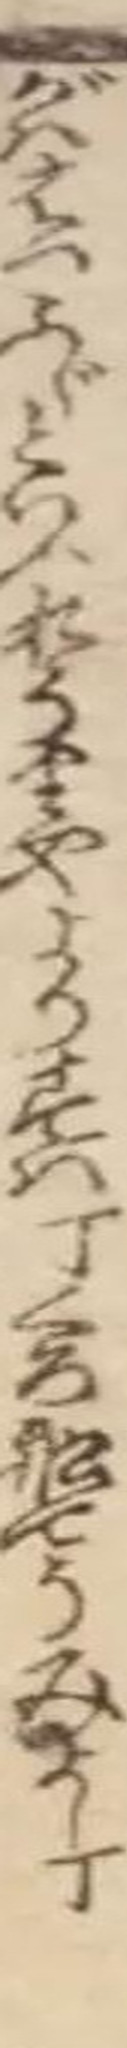がははつふじといふれうりやよりすは丁くろ舩てうみよし丁
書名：関東大地震末代鑑
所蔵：国立国会図書館 National Diet Library, JAPAN
